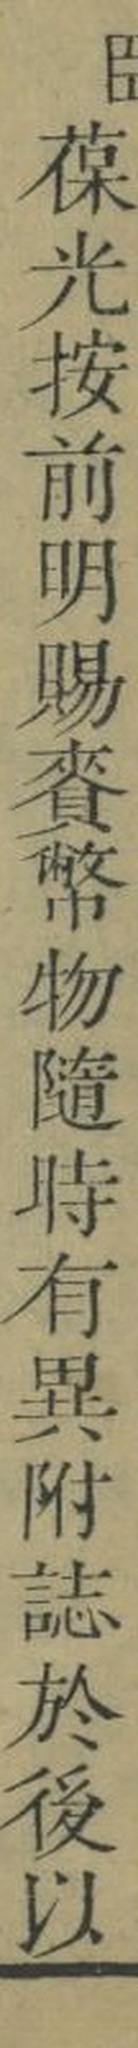臣葆光按前明賜賚幣物隨時有異附誌於後以
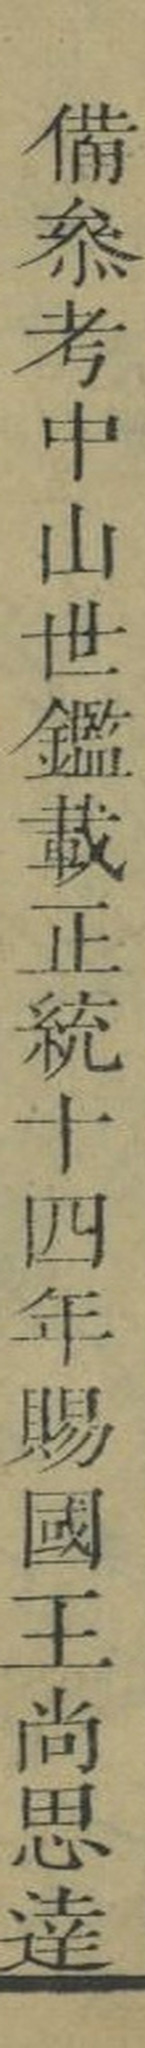備叅考中山世鑑載正統十四年賜國王尚思逹
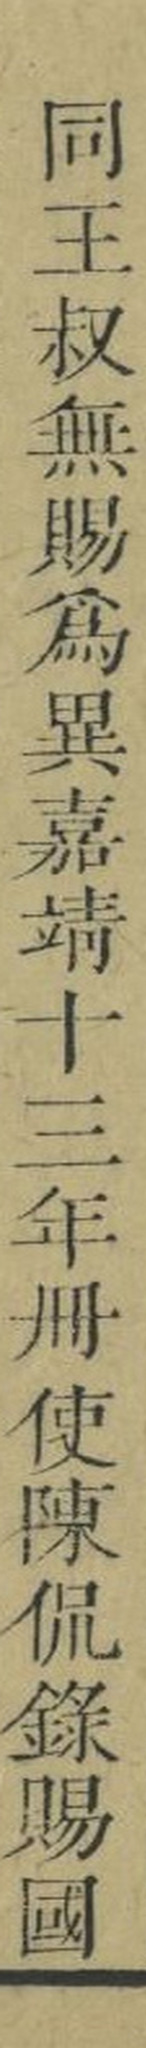同王叔無賜爲異嘉靖十三年册使陳侃錄賜國
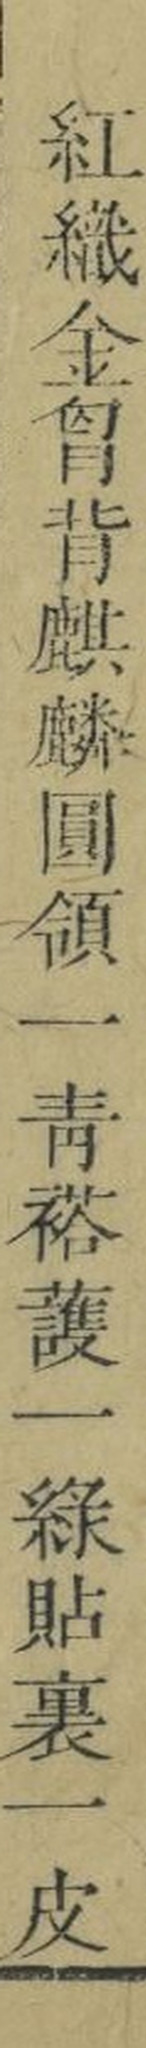紅織金胷背麒麟圓領一靑褡護一綠貼裏一皮

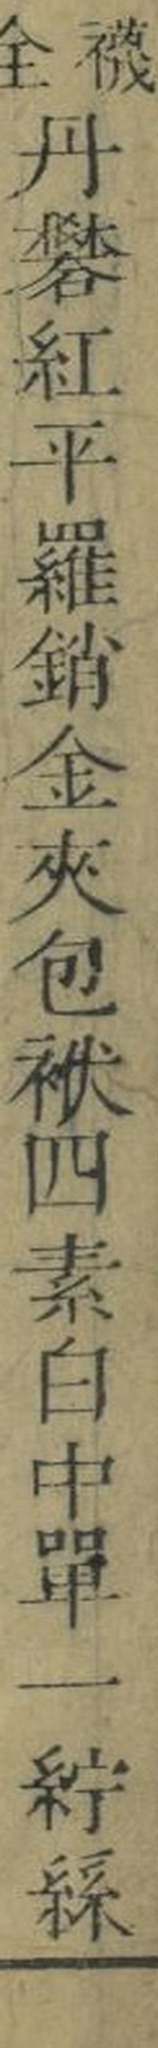襪全丹礬紅平羅銷金夾包袱四素白中單一紵絲
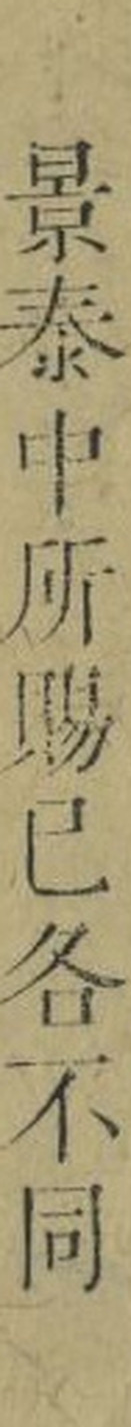景泰中所賜巳各不同
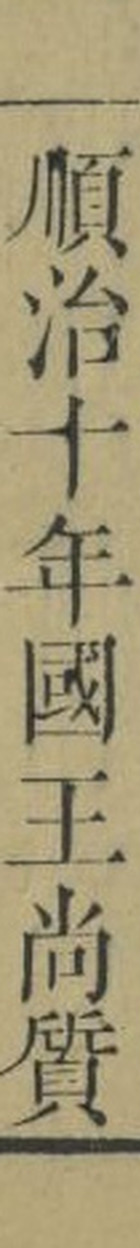順治十年國王尚質
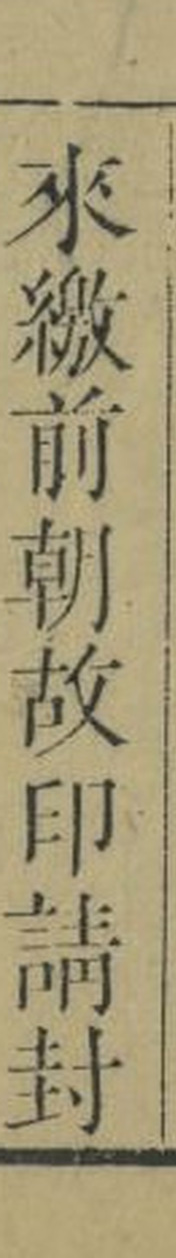來繳前朝故印請封
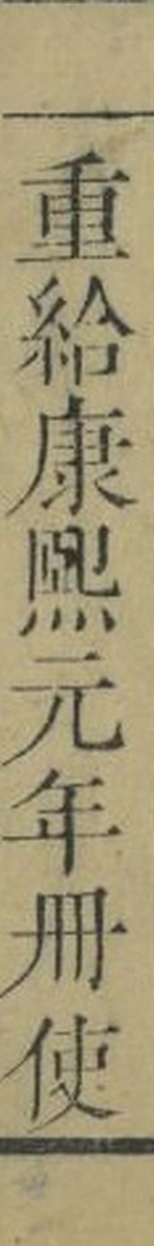重給康煕元年册使
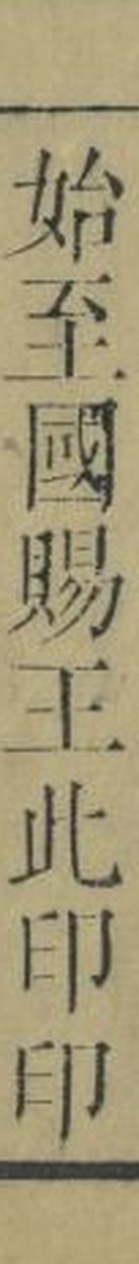始至國賜王此印印
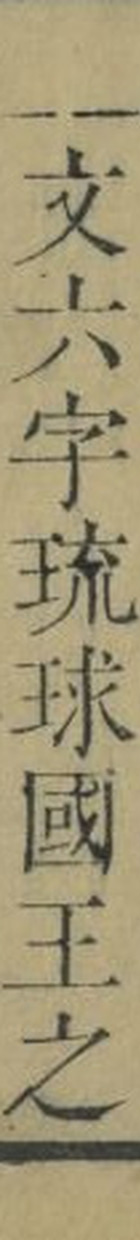文六字琉球國王之
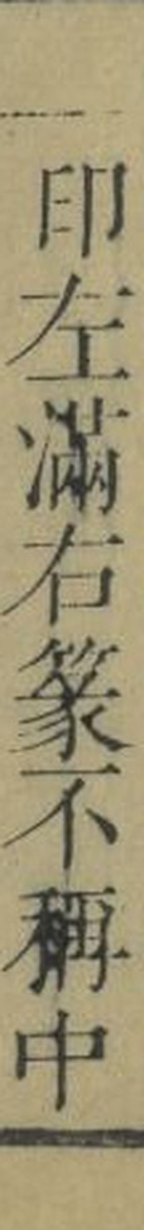印左滿右篆不稱中

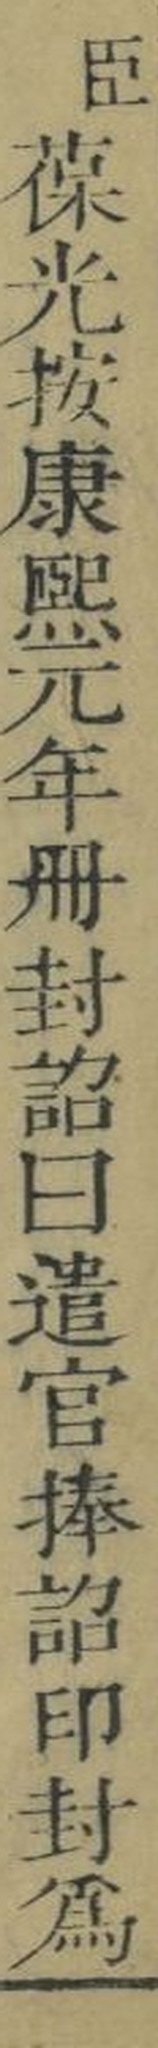臣葆光按康煕元年冊封詔曰遣官捧詔印封爲
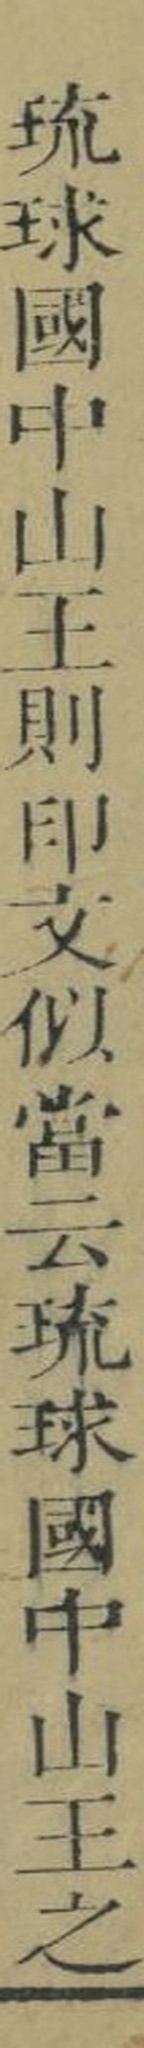琉球國中山王則印文似當云琉球國中山王之
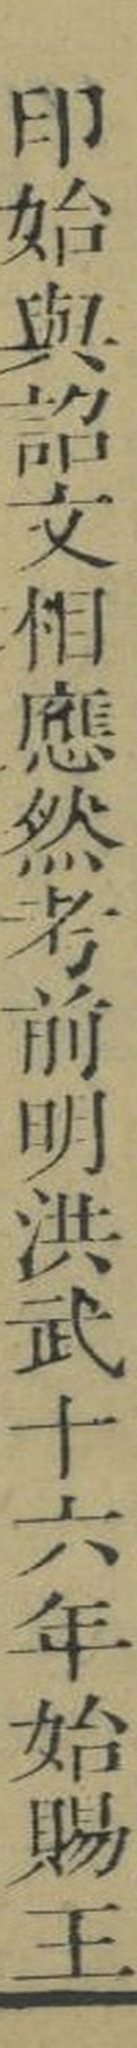印始與詔文相應然考前明洪武十六年始賜王
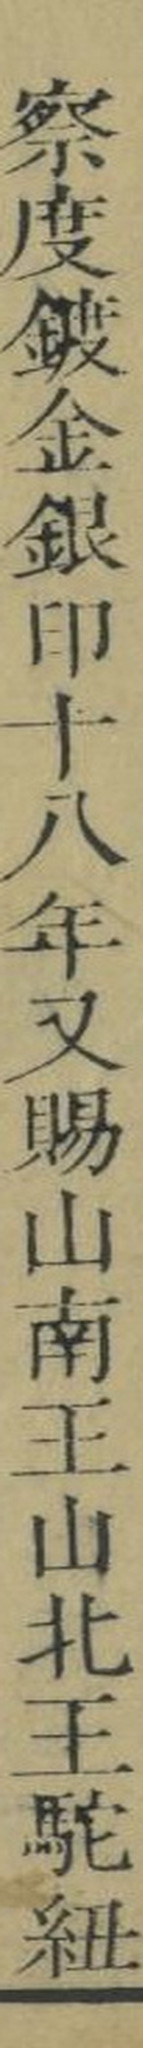察度鍍金銀印十八年又賜山南王山北王駝紐
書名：中山伝信録 巻二
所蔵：University of the Ryukyus Library
